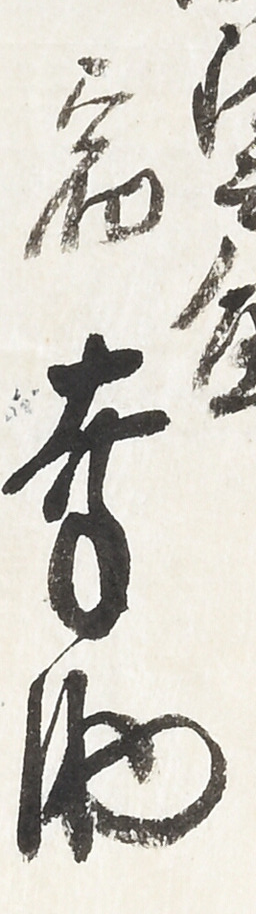宿幸助
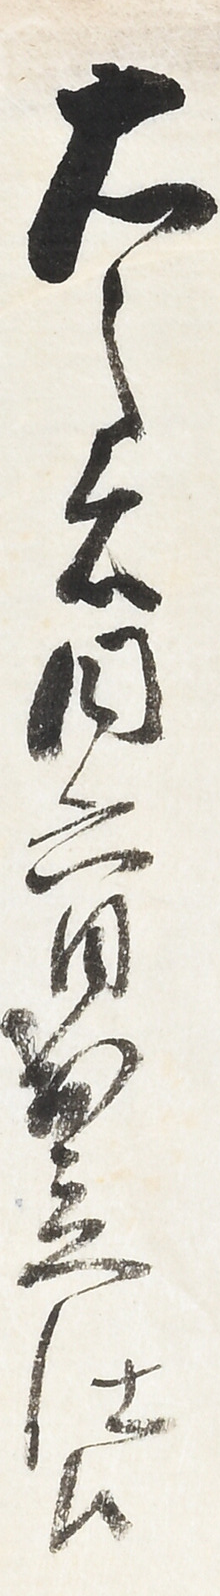右之者同六日出立仕候
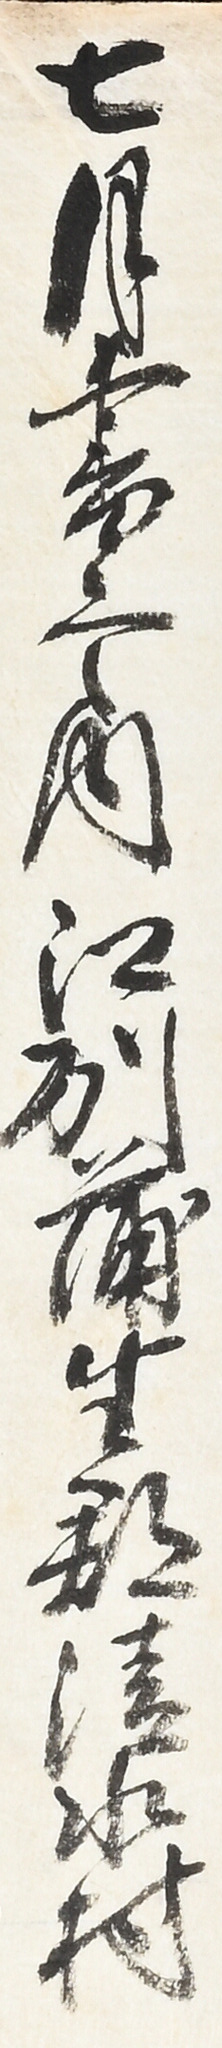七月書上之内江州蒲生郡清水村
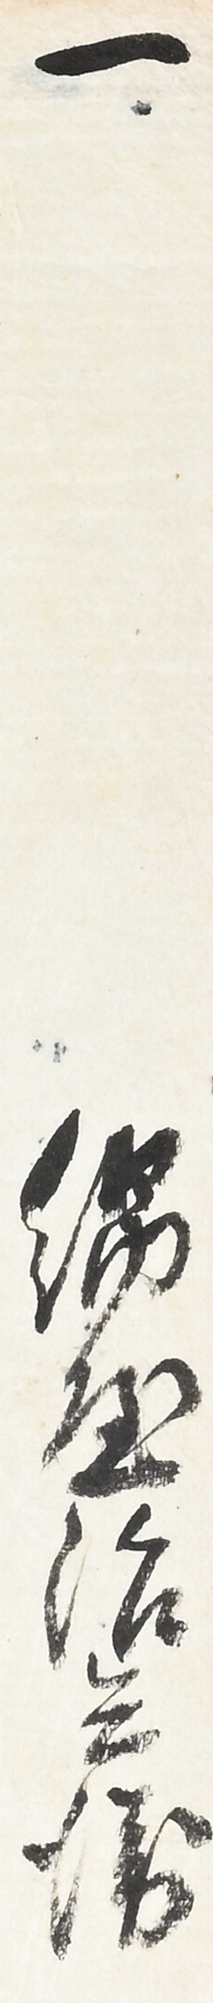一綿屋治兵衛
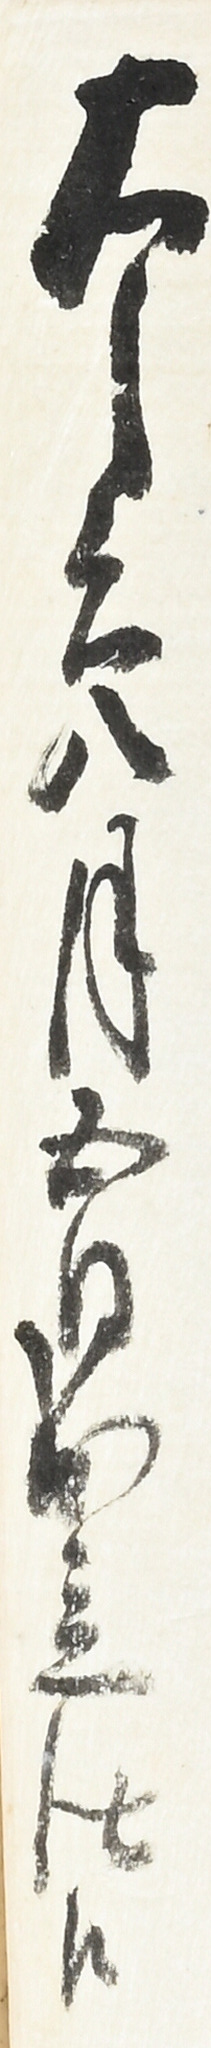右之者八月五日出立仕候
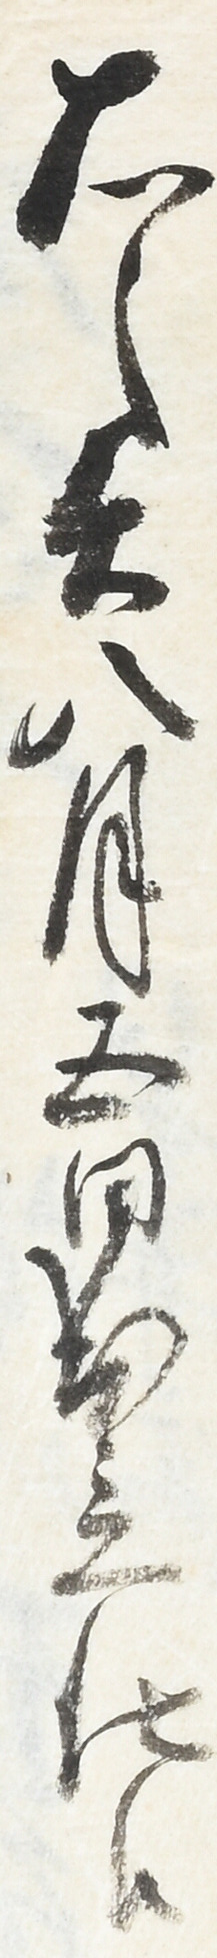右之者八月五日出立仕候

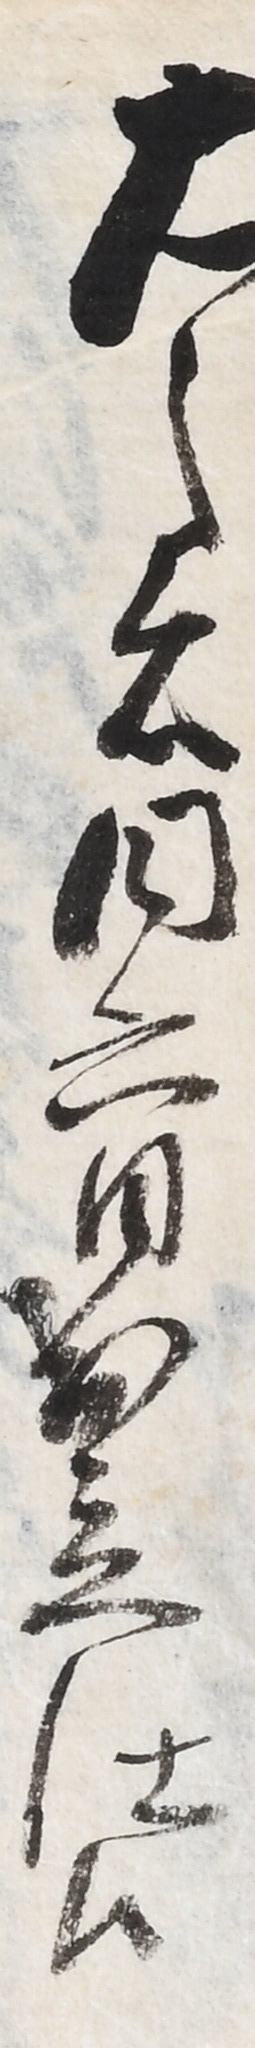右之者同廿六日出立仕候
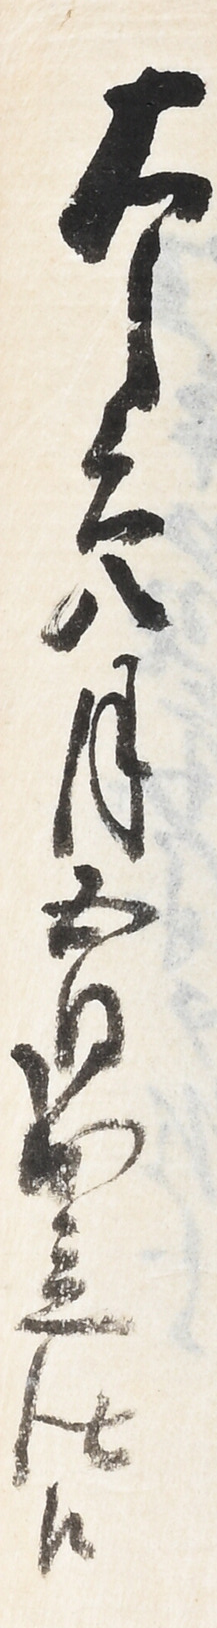右之者八月五日出立仕候
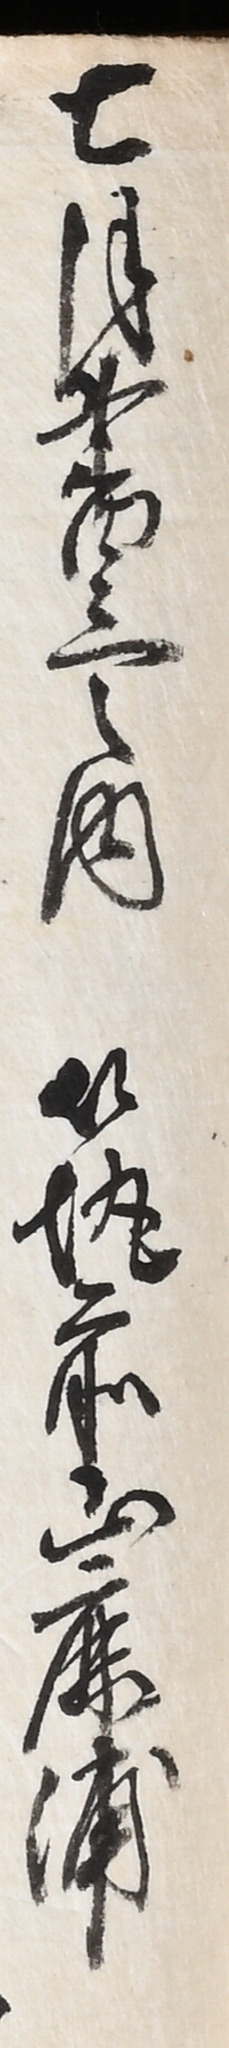七月書上之内筑前山鹿浦
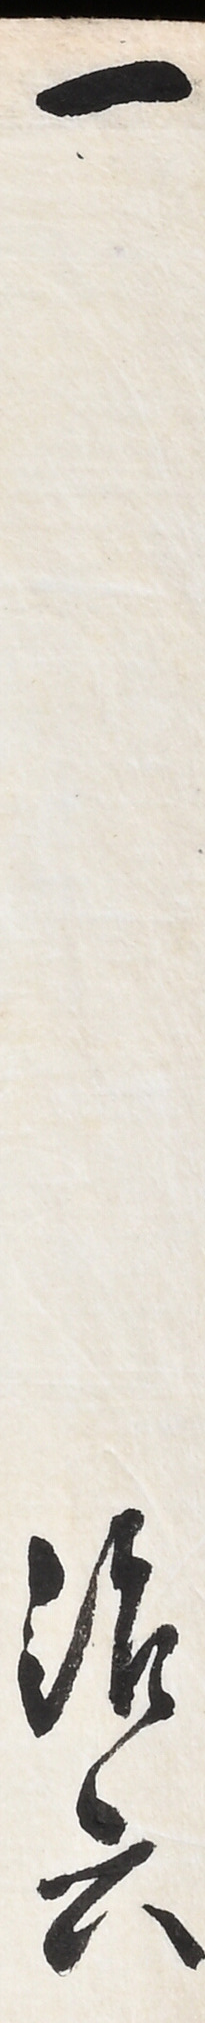一治六
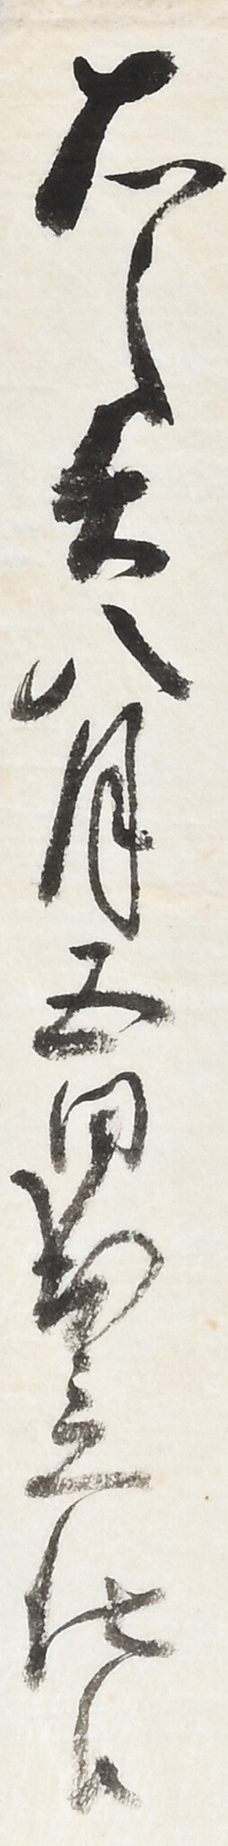右之者八月五日出立仕候
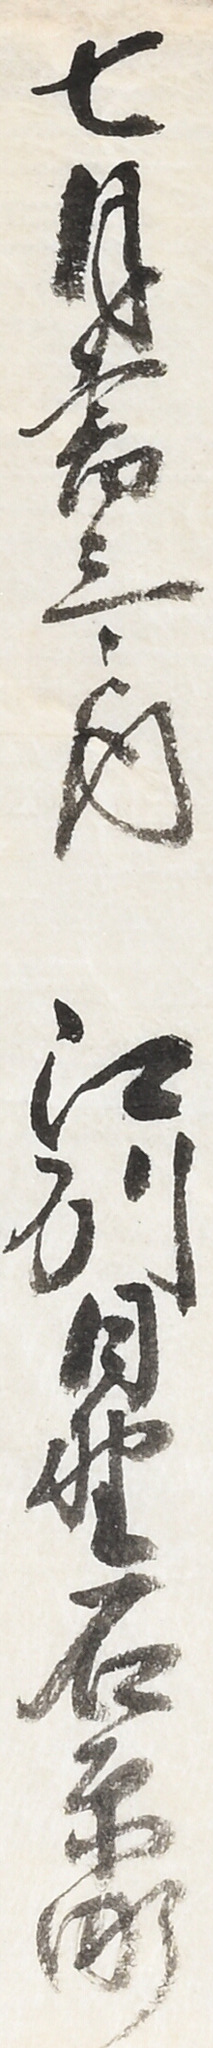七月書上之内江州日野石原町
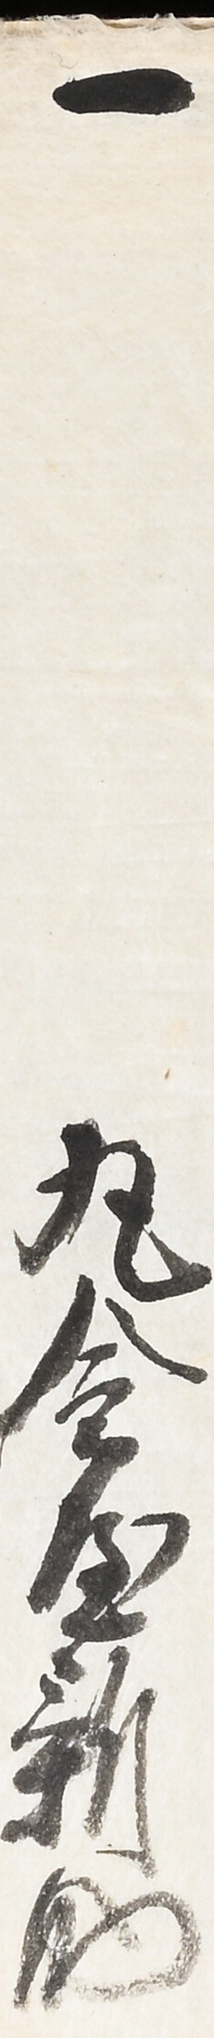一丸金屋新助
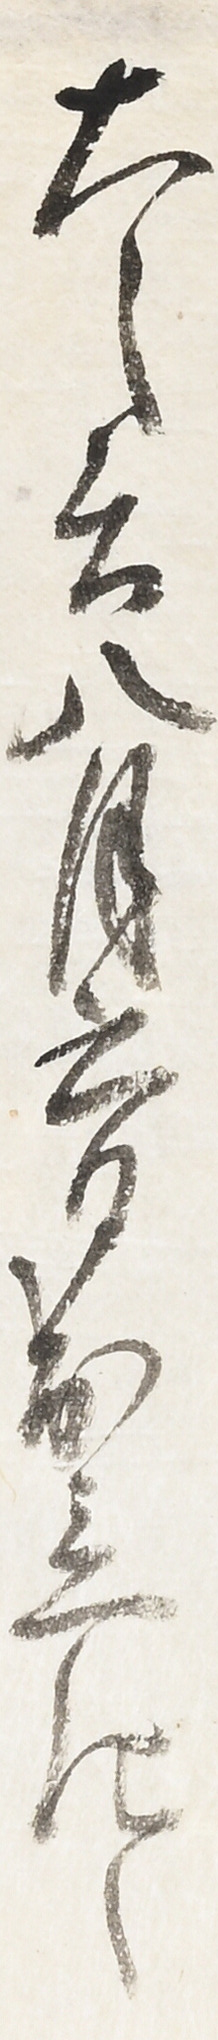右之者八月六日出立仕候
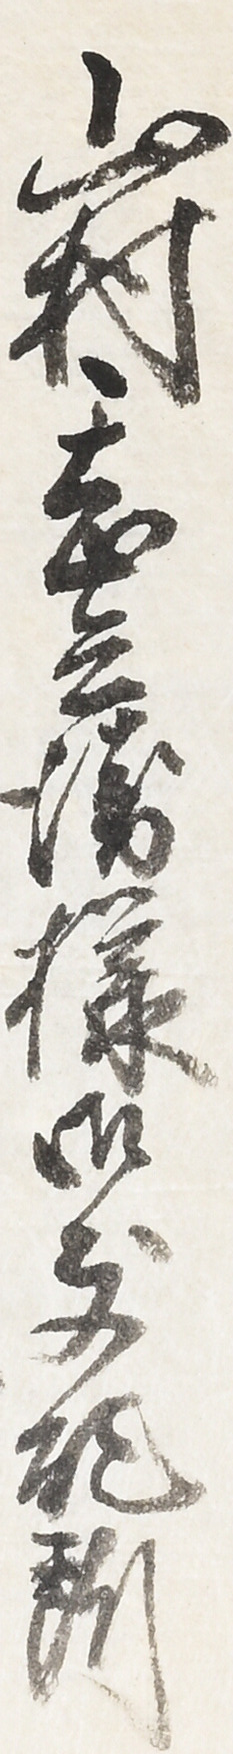山村甚兵衛様御支配所
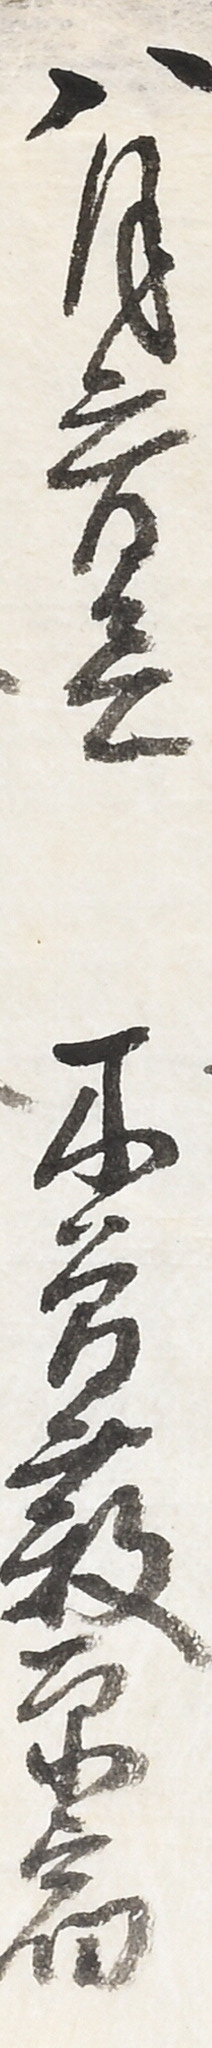八月六日着木曽藪原宿
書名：旅人泊控帳
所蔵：伊那市立高遠町図書館・合同会社AMANE
